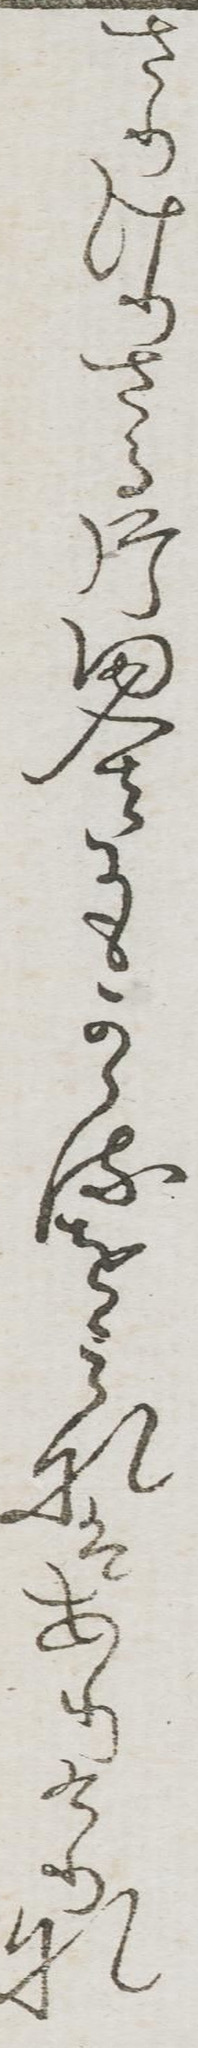さりけり片田舎にもかゝるをみなはありけりな

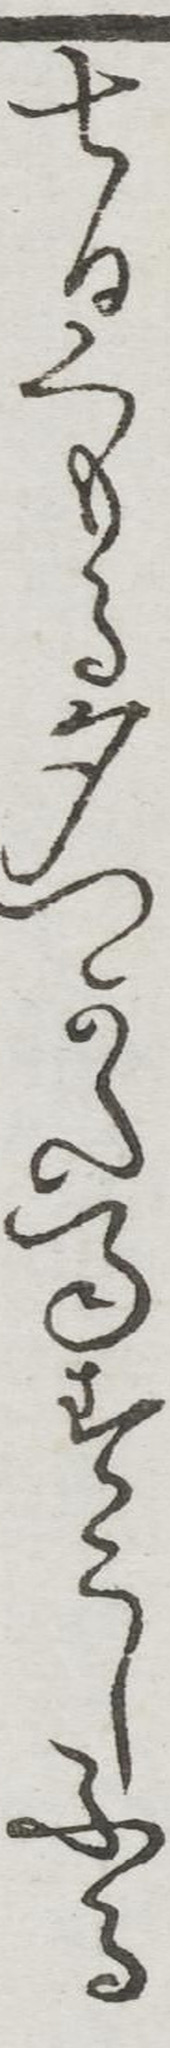七日くもる夕つかた雨すこしふる
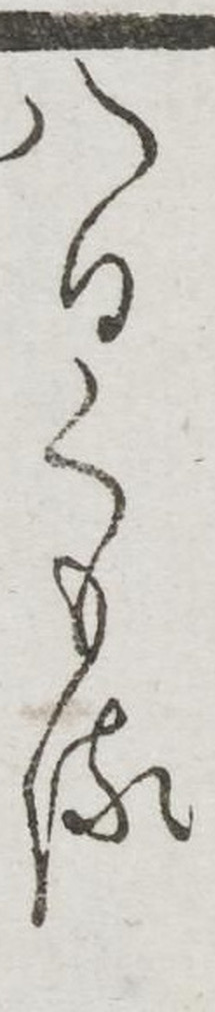八日くもる
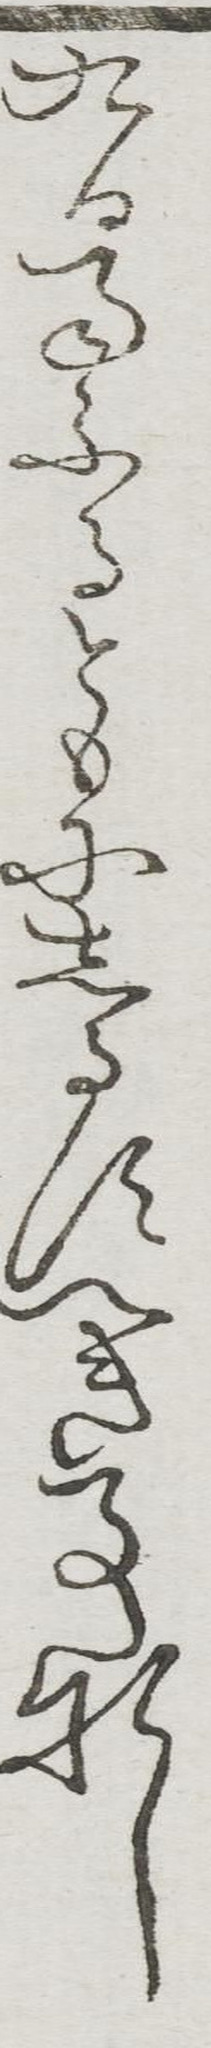九日雨ふるともにしるすへき事なし
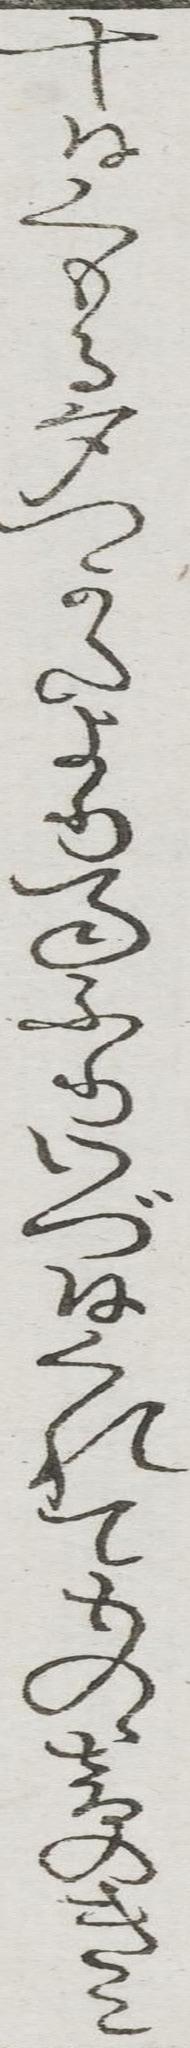十日くもる夕つかたより雨ふりいづ日くれてものゝ音のきこ
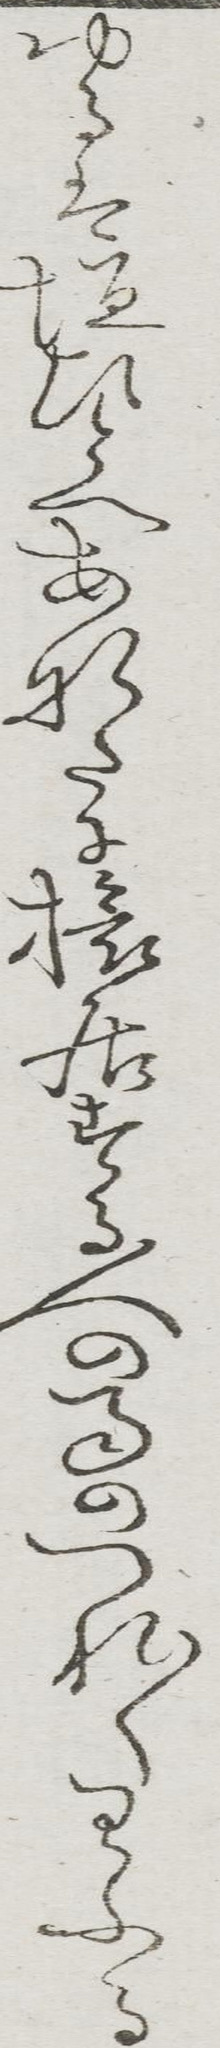ゆるは垣ひとへあなたに旅居する人の雨のつれ〳〵わふる
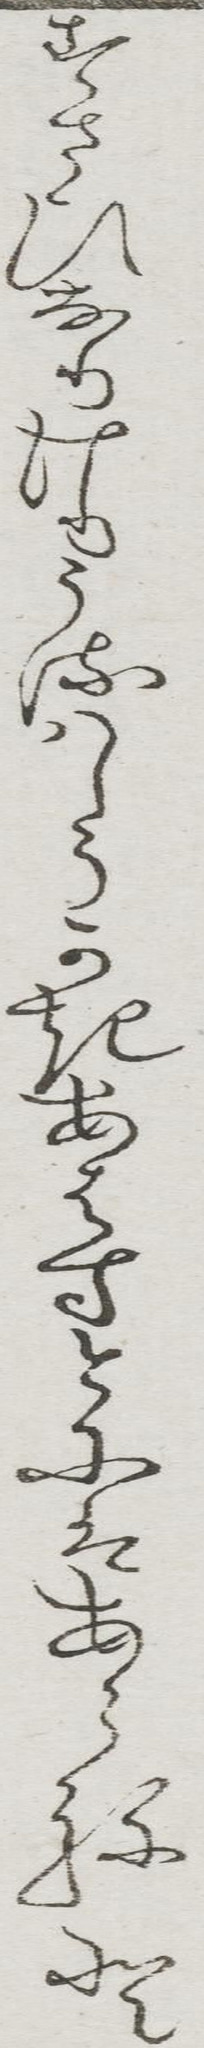すさひなりけりうるはしうかきあはすとにはあらねと
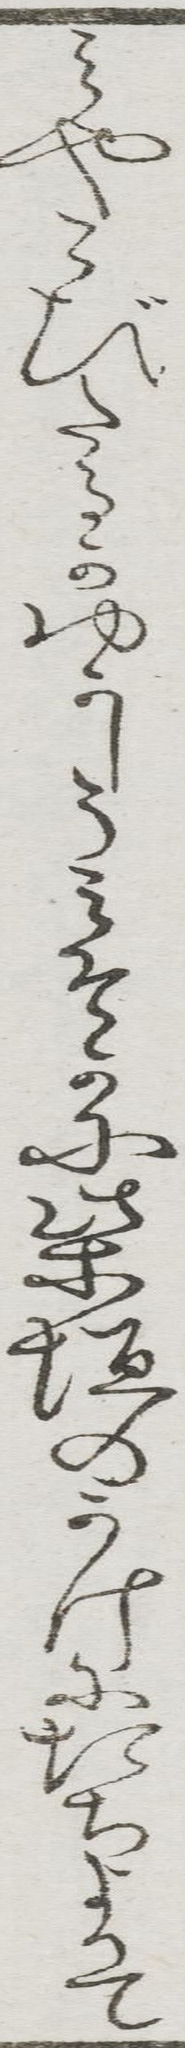みやこびたるかゆかしうみそかに柴垣のかけにたちよりて
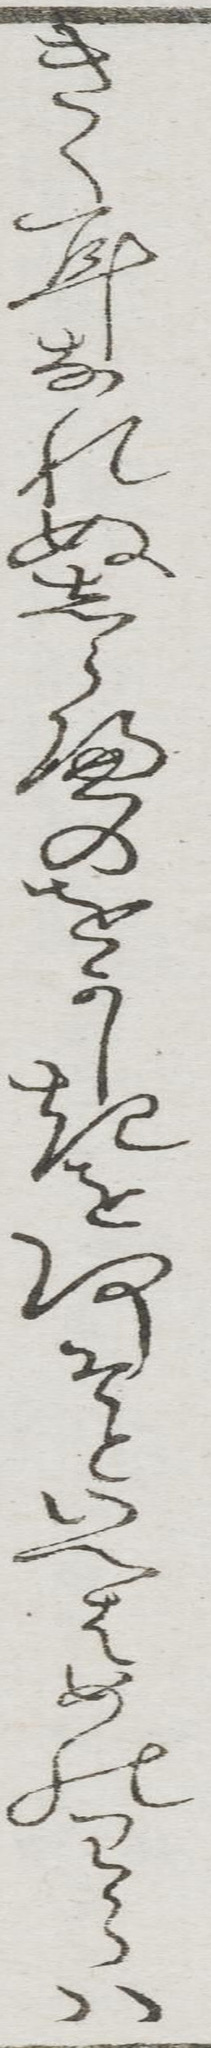きく耳なれぬしらへのをかしきを何そといへはめのわらは
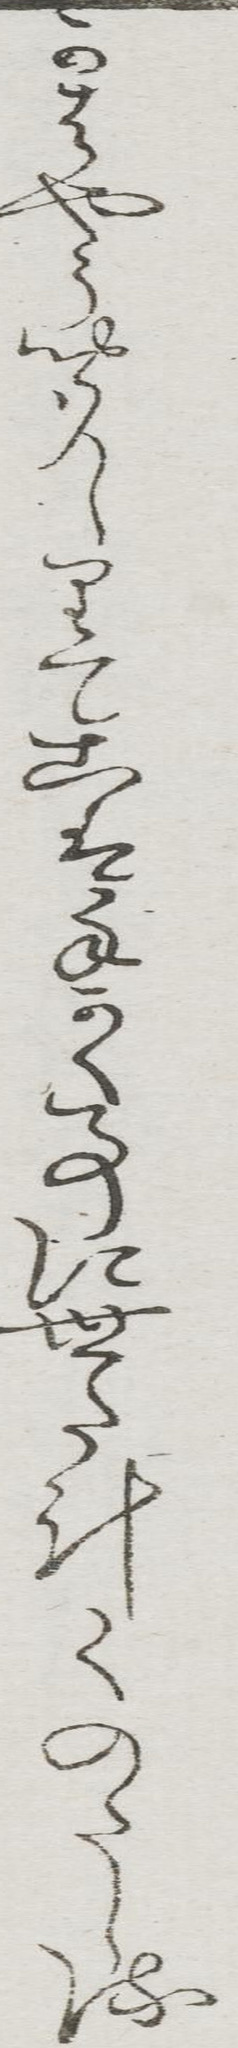かはやう聞しりてこは手かく事に世たけくのゝしる
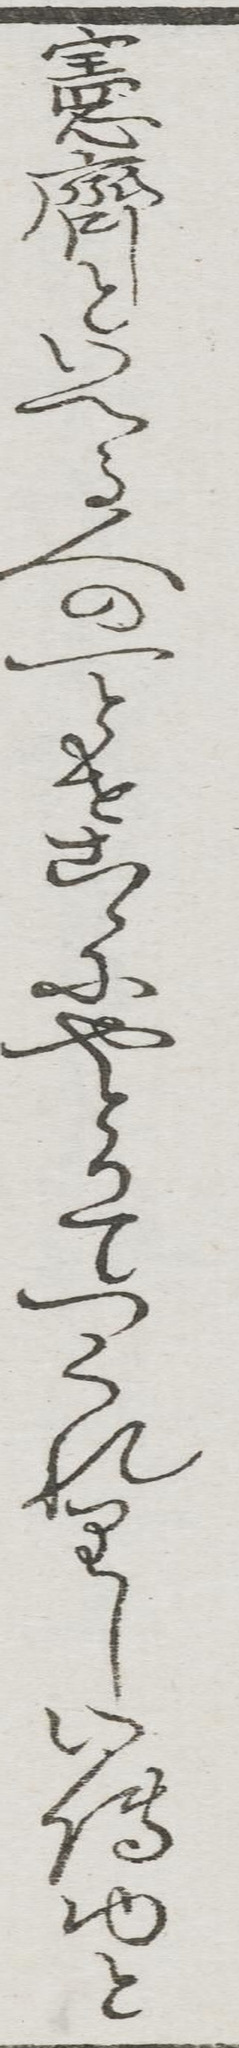憲齊といへる人の一とせこゝにやとりてつくれりしいてゆと
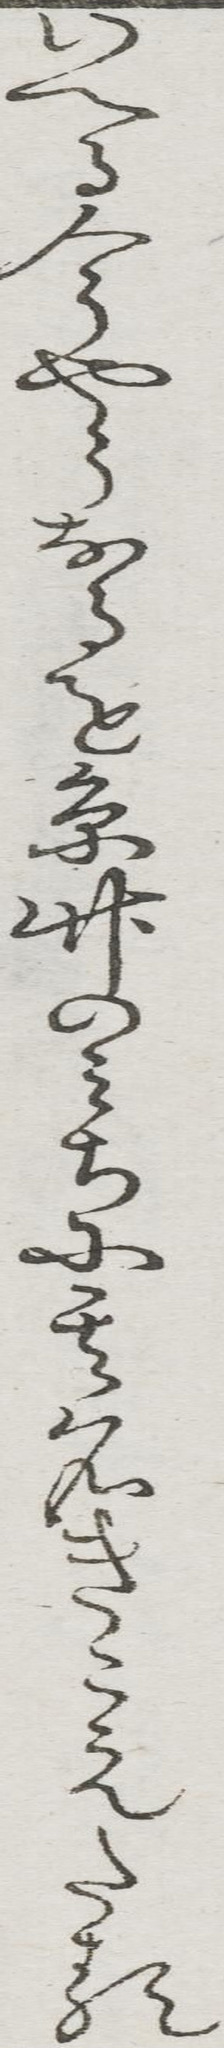いへる今やうなるを糸竹のみちに其名きこえたる
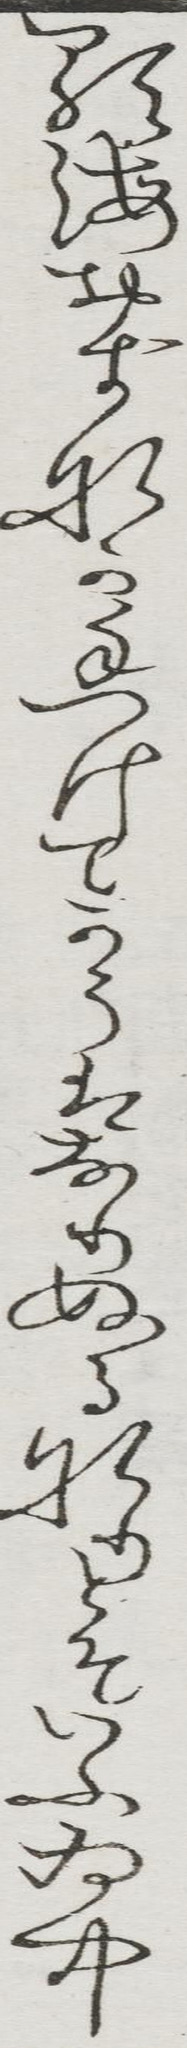歌海おきなか手つけてかうはなりぬるなりとそいふゐ中
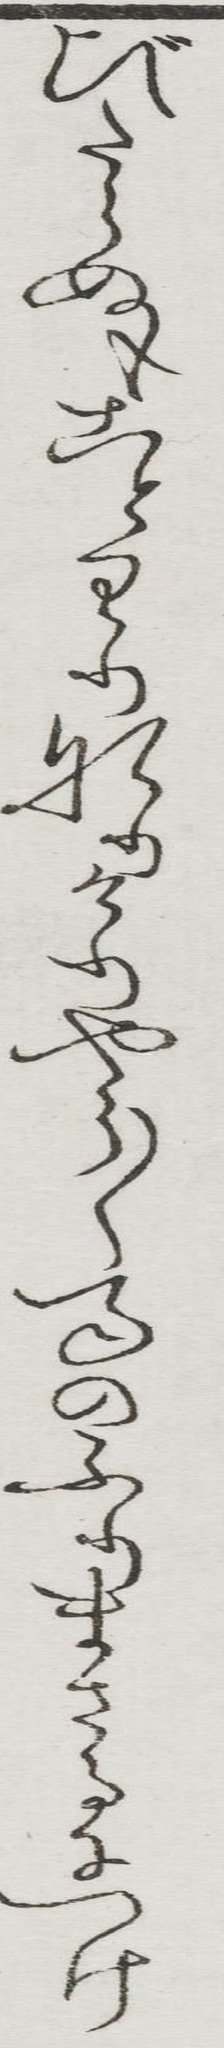びたらぬもことわりなりけりやう〳〵雨のふりまさるにつけ
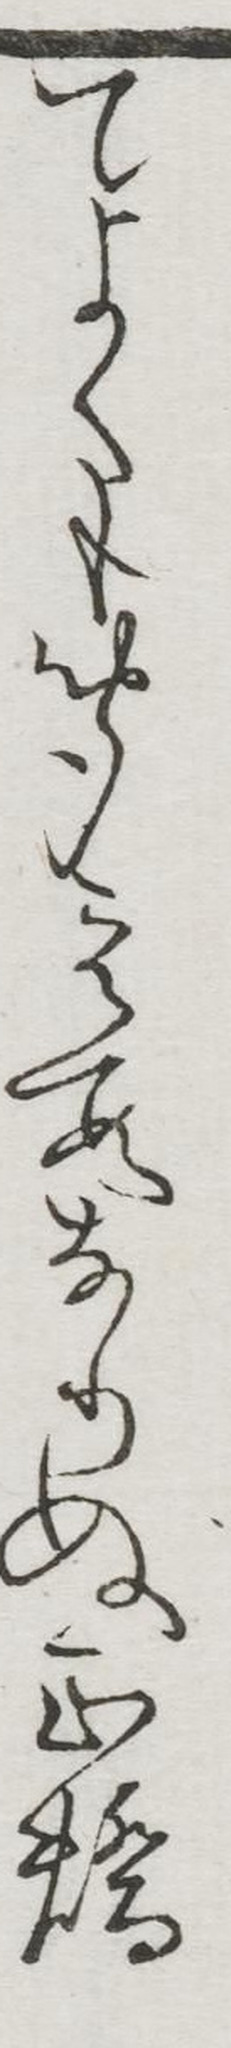てよくも聞えすなりぬ正矯
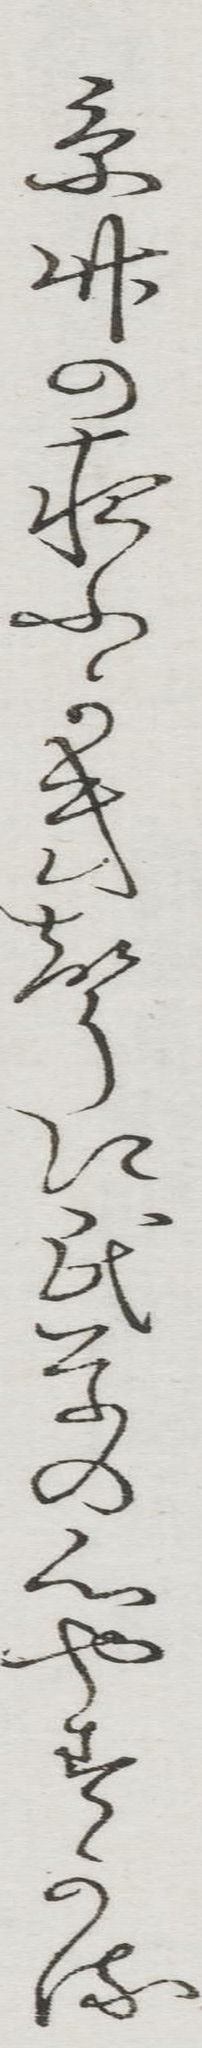糸竹の夜ふかき声に民草の心やすかる
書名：挿画熱海日記　全
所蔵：東京大学地震研究所図書室 Earthquake Research Institute Library, The University of Tokyo, JAPAN
